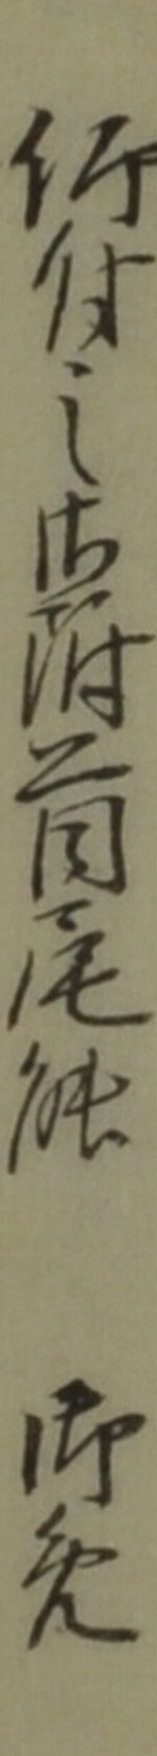緒仰付之御附首尾能御免
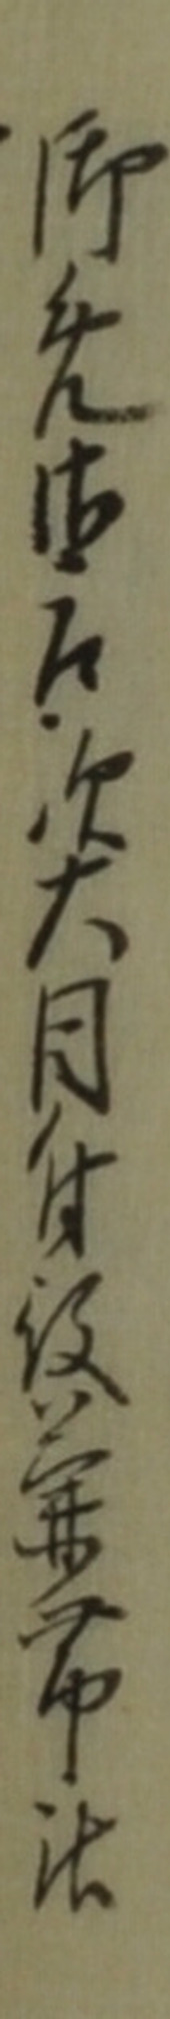御免御取次大目付役兼帯被
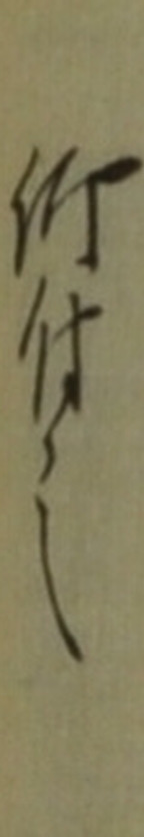仰付之
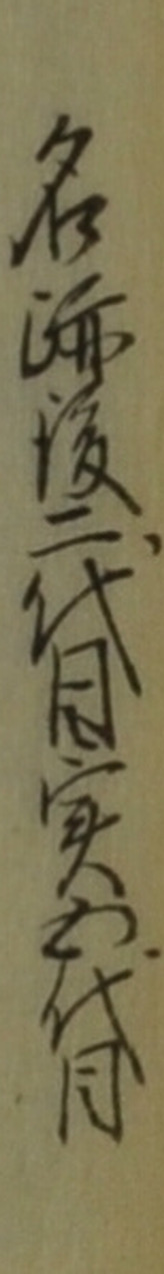名跡後二代目実五代目
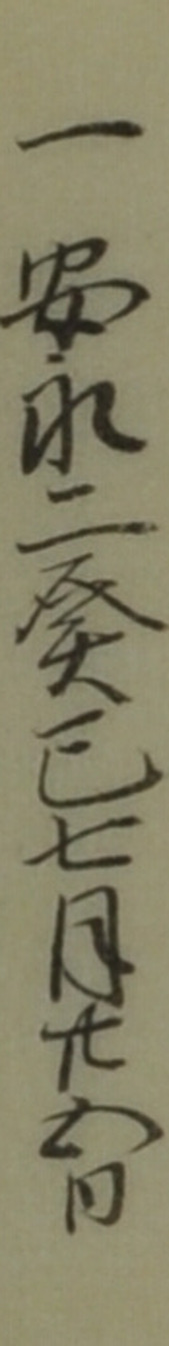一安永二癸巳七月廿五日
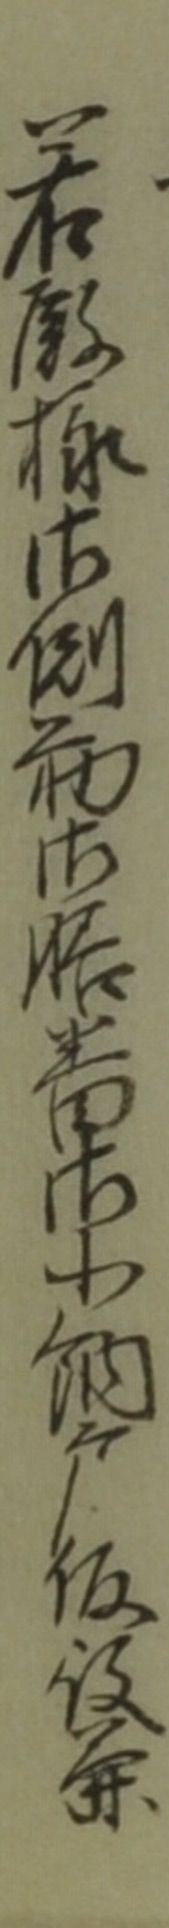若殿様御側勤御膳番御小納戸仮役兼
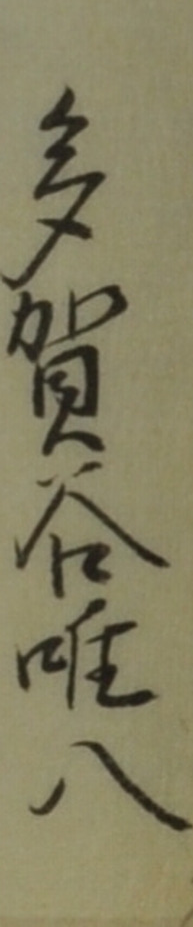多賀谷唯八
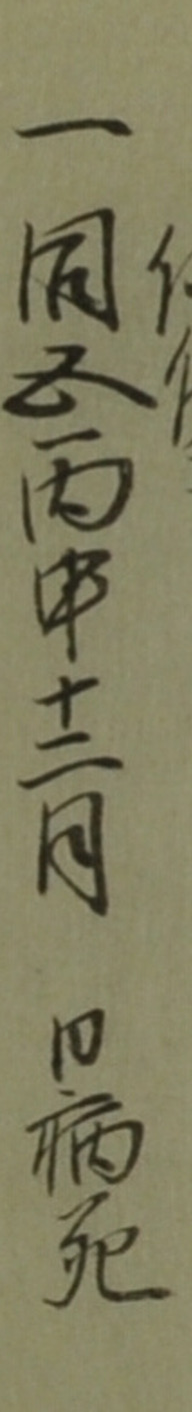一同五丙申十二月日病死
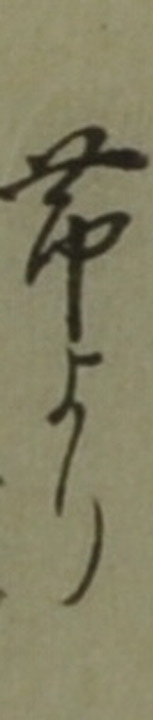帯より
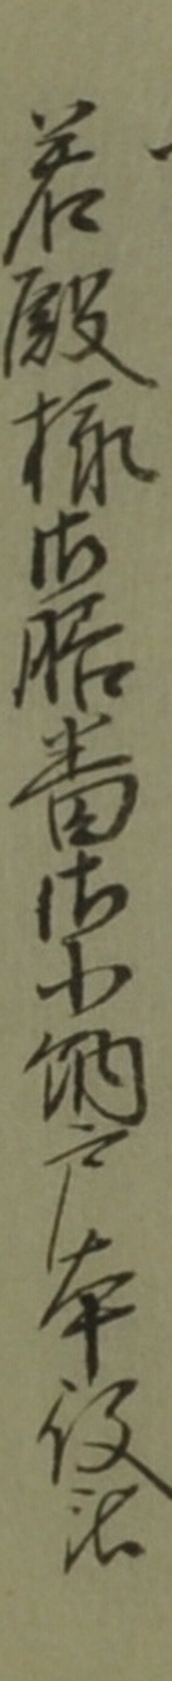若殿様御膳番御小納戸本役被
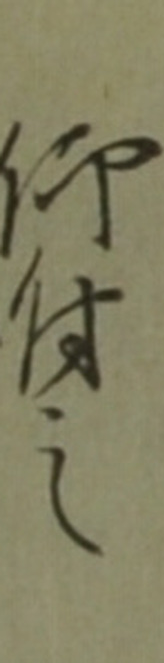仰付之
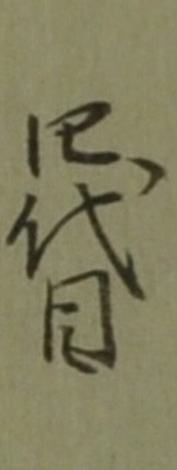四代目
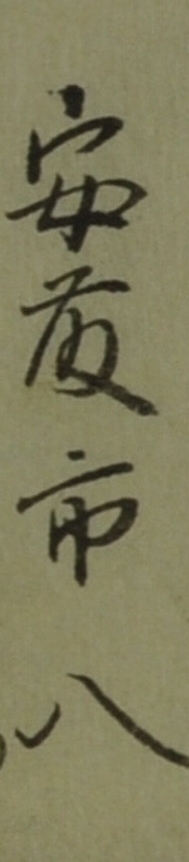安藤市八
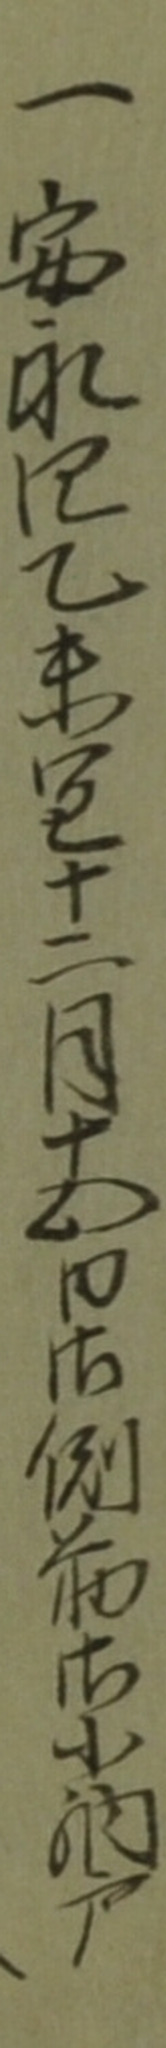一安永乙未閏十二月十五日御側勤御小納戸
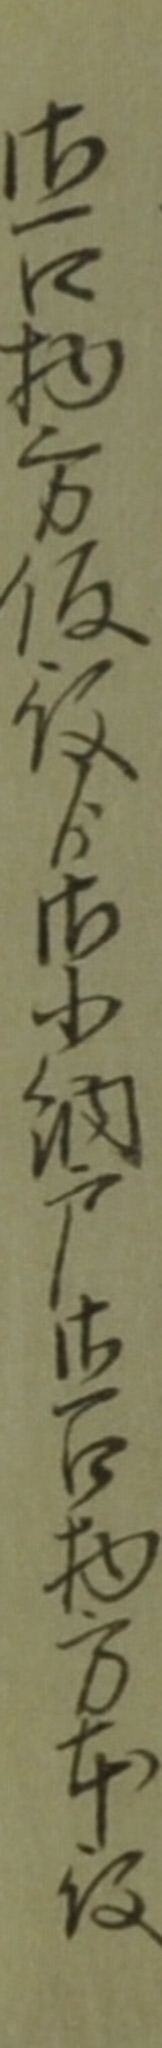御召物方仮役ゟ御小納戸御召物方本役
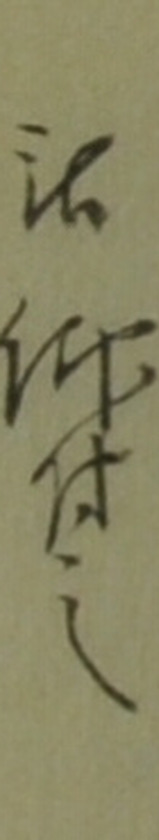被仰付之
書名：諸御役代々録（四）
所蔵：伊那市立高遠町図書館・合同会社AMANE
